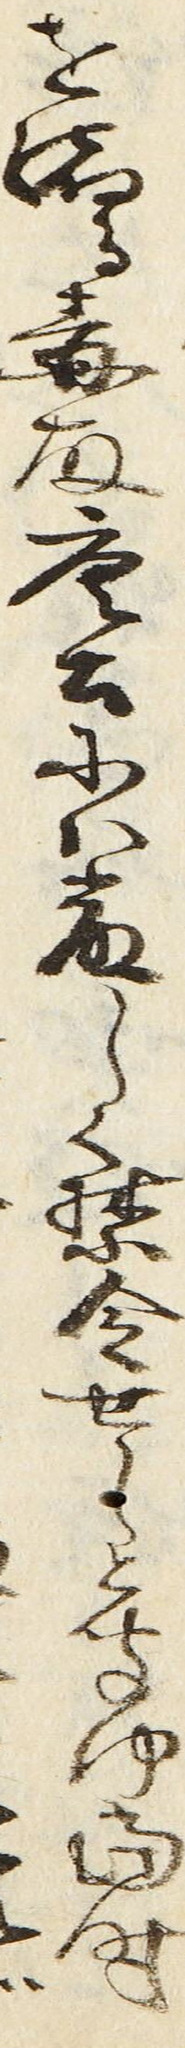を縮る毒故唐土にハ厳しく禁令せしと聞ゆ当時
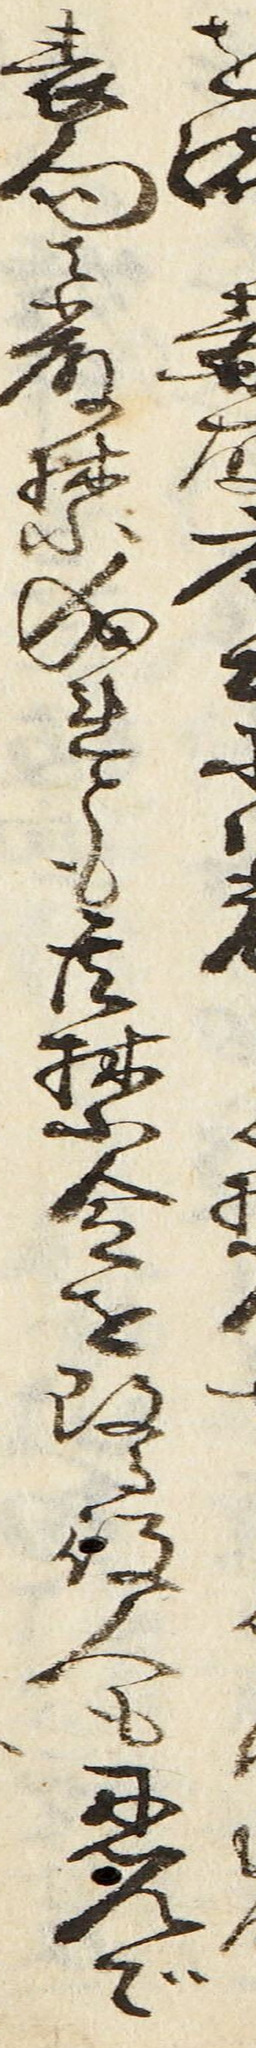表向は厳禁成れとも其禁令を改る役人も忍んで
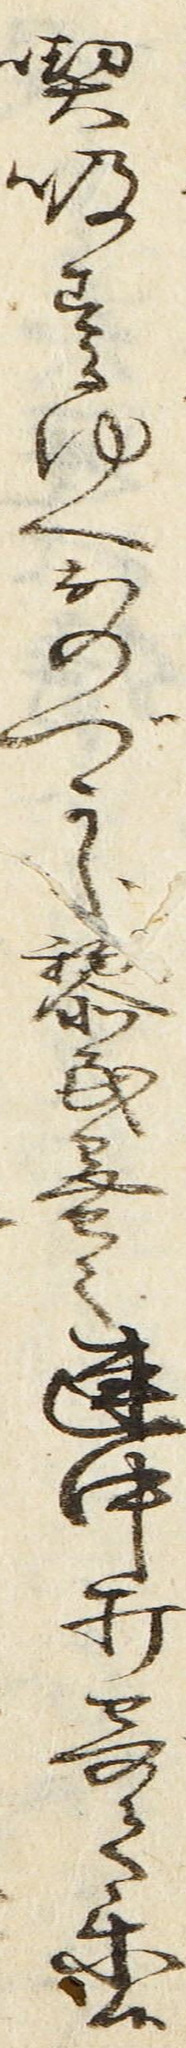喫吸するゆへおのづから黎民尽く連中打寄て楽候
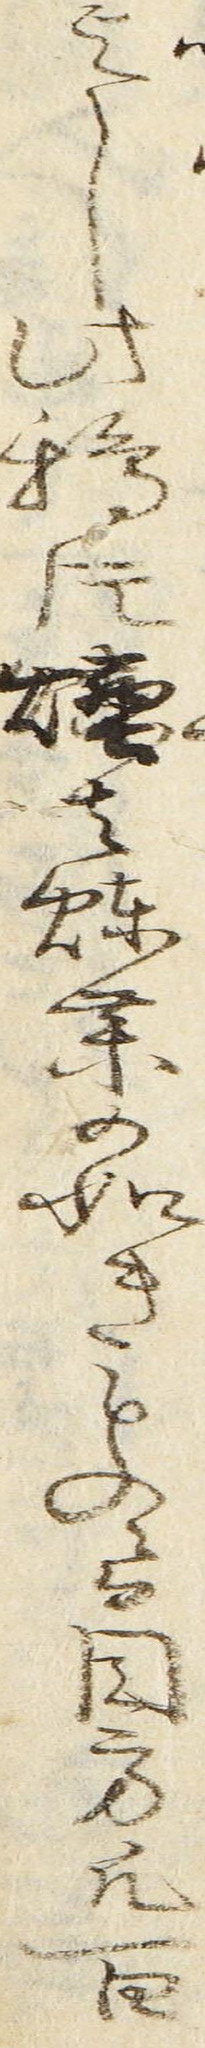よし此鴉片煙は煉薬の如きものニ而目方凡一匁

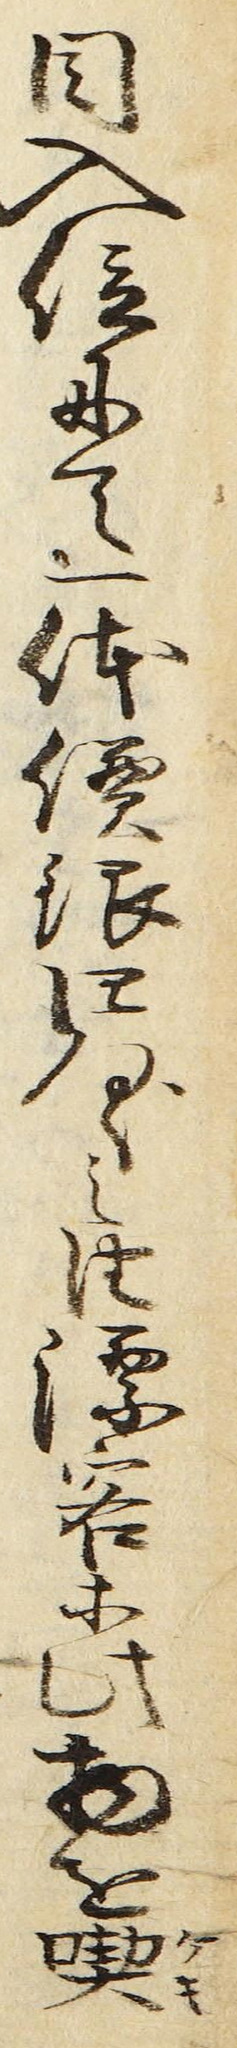目入位にて一体価銀四匁之由漂客等此物を喫
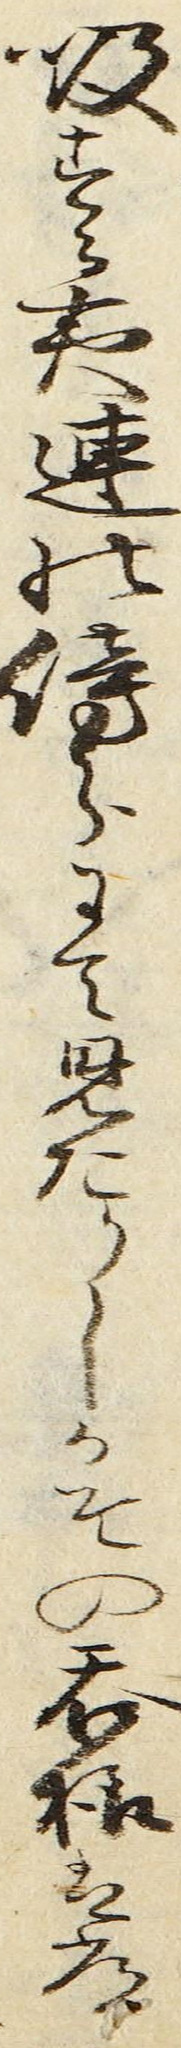吸する夷連の傍らにて見たりしかその呑様は常
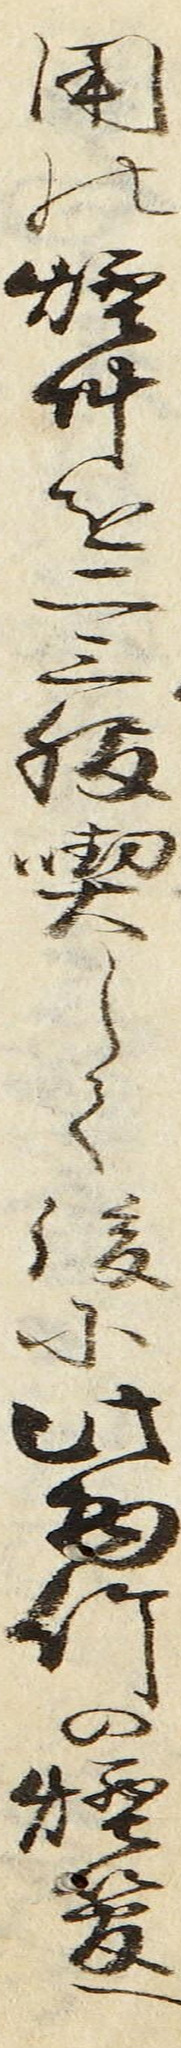用の煙草を二三服喫して後に此物竹の煙管へ
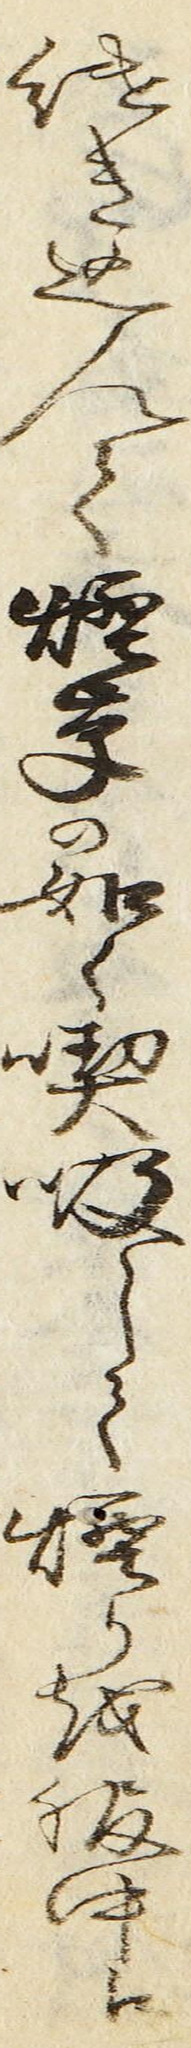継き込んて煙草の如く喫吸して煙りを腹中え
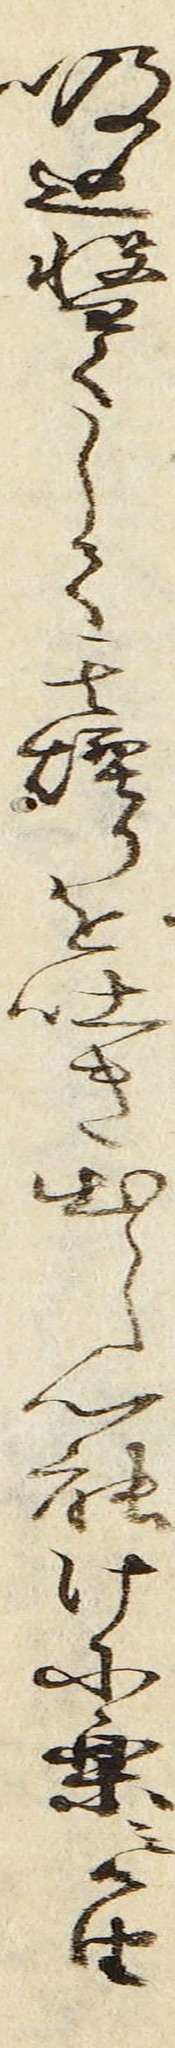吸込暫くして其煙りを吐き出し心能けに楽ミ候由
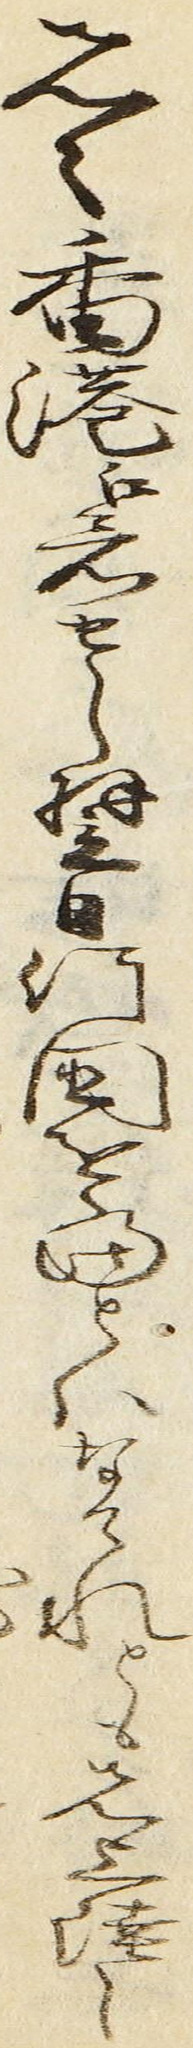先之香港え着セし翌日何国を当とハなけれとも先上陸し
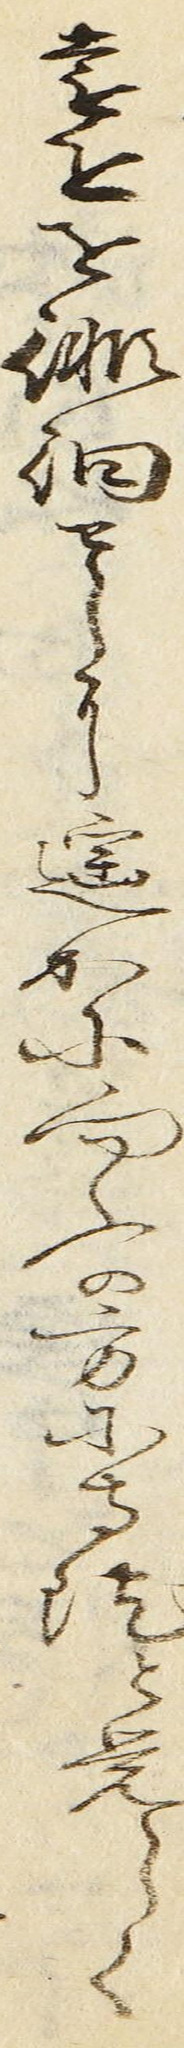遠近を徘徊セしに遥かに向ふの方に寺院と覚しく
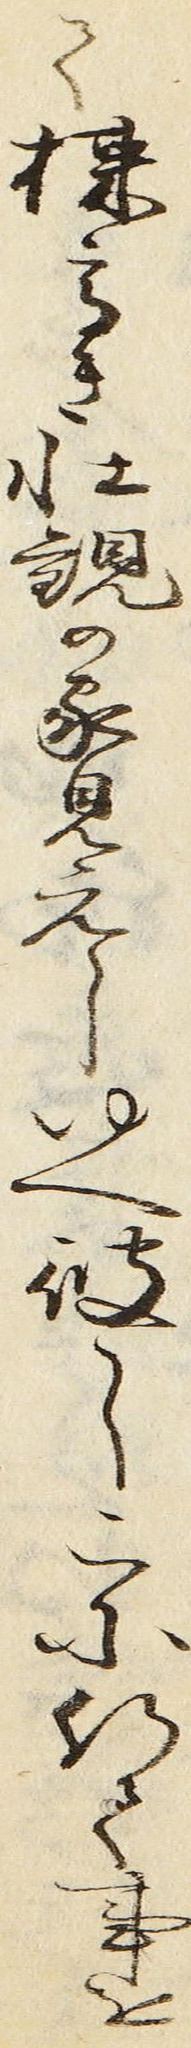て棟高き壮観の家見えしゆへ彼しこに行て事を
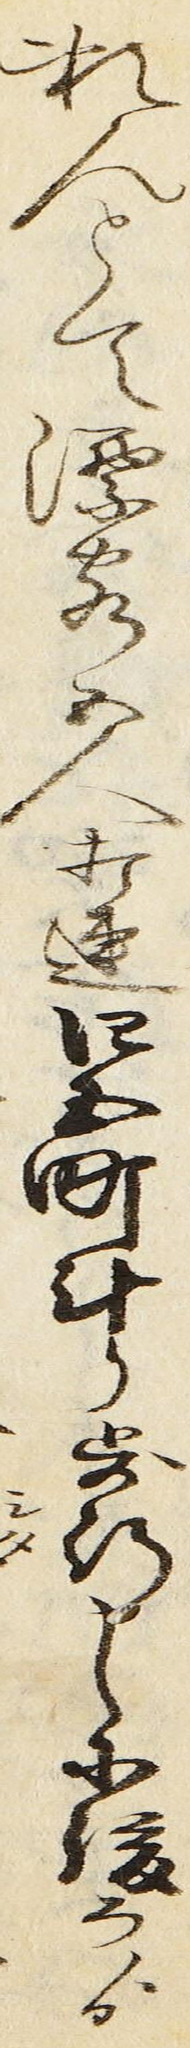頼んとて漂客五人打連四五町計り歩行申に後ろゟ
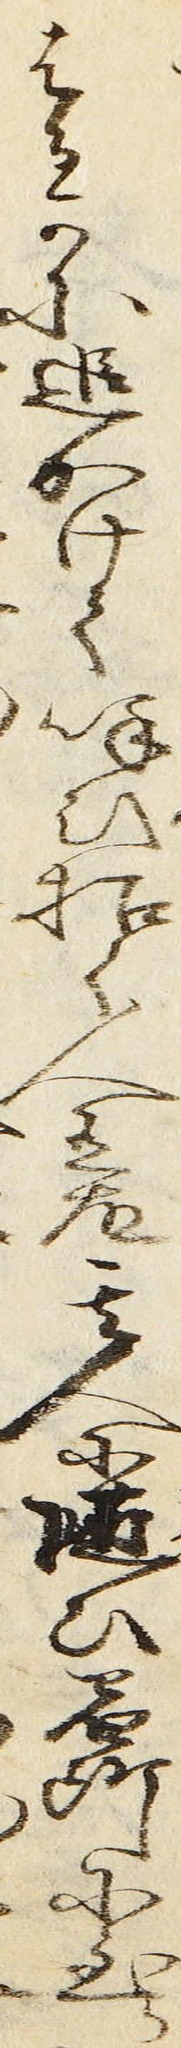はるかに追かけて呼ひ招く人有故其人に随ひ宿所に至り
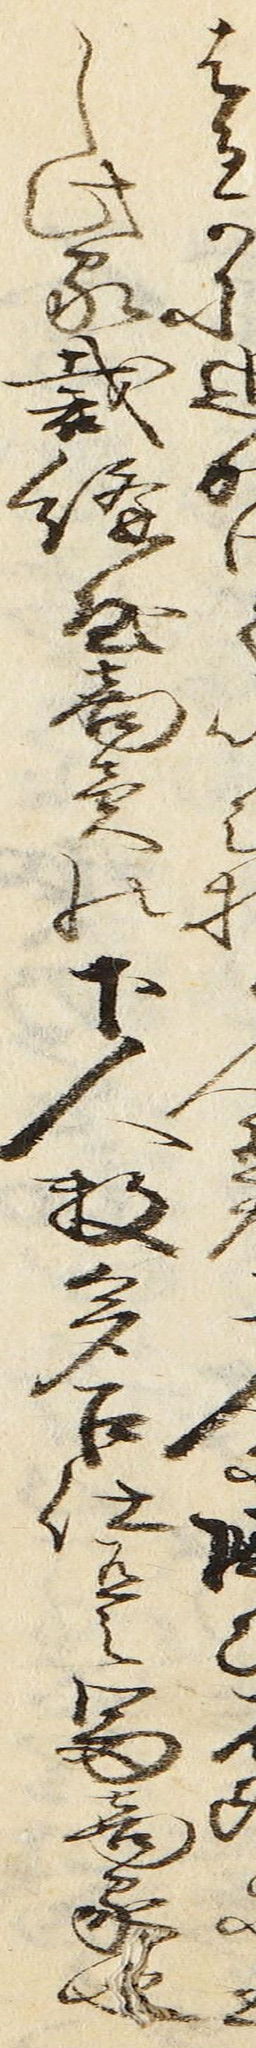し此家裁縫屋商売の下人数多召仕有之易商家也
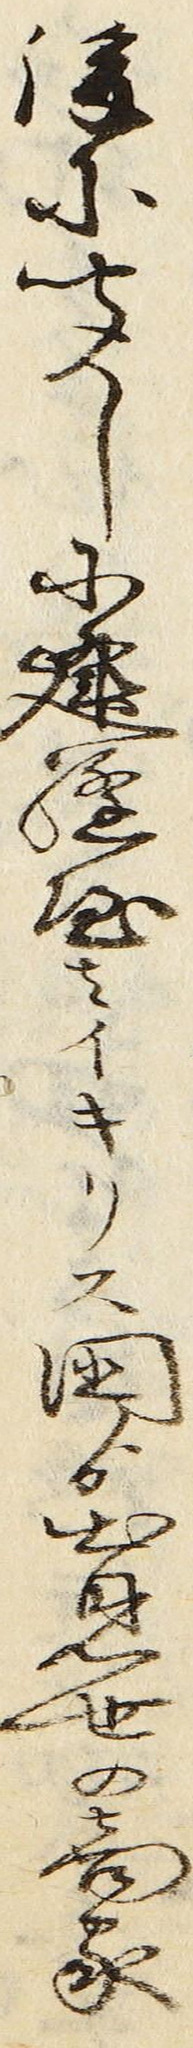後に聞しに建縫屋はイキリス国ゟ出見世の商家
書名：亜墨利加漂流記聞
